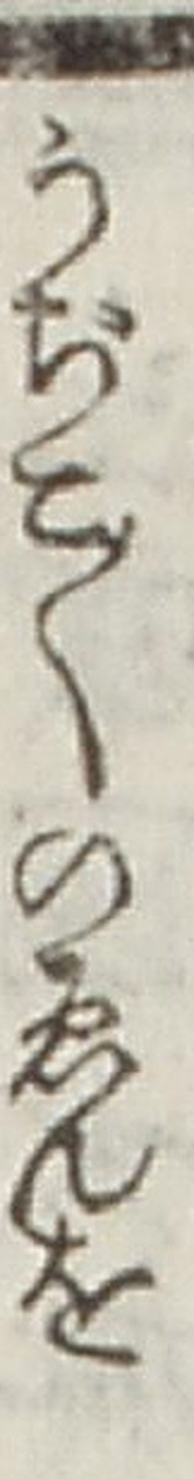うぢこ〳〵のゑんを
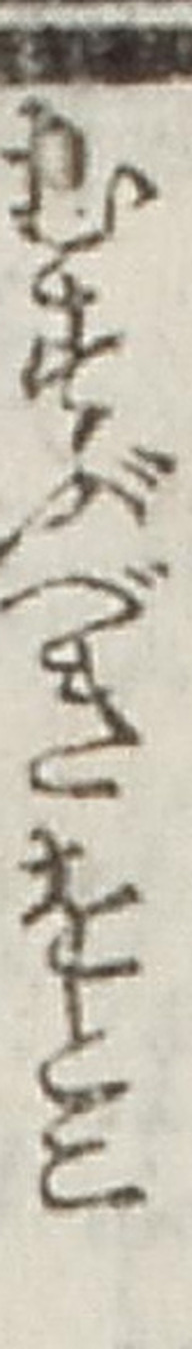むすぶべきをとこ
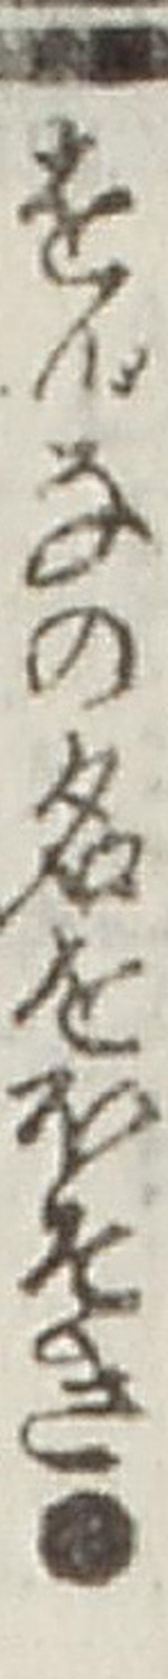をんなの名をほそき●
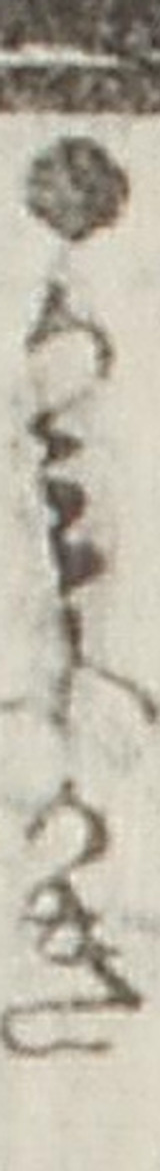●かみにかき
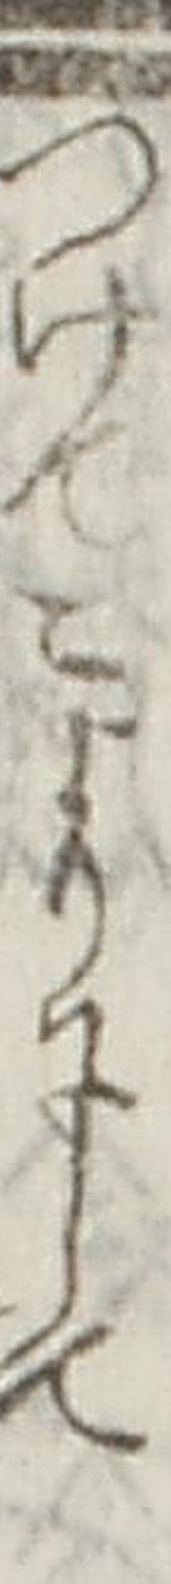つけてこよりにして
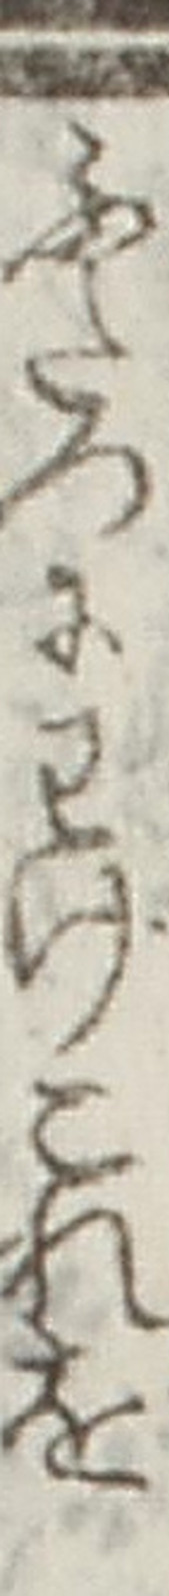ふたつにわけこれを
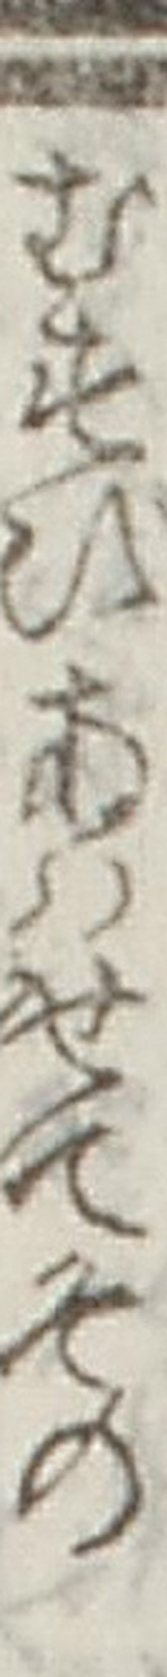むすびあはせてその
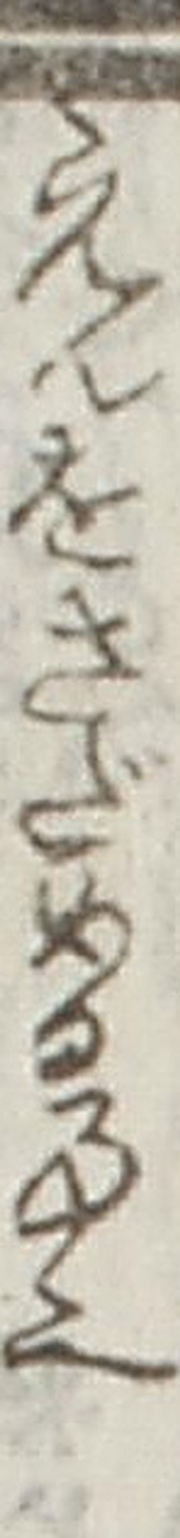えんをさだめる事也
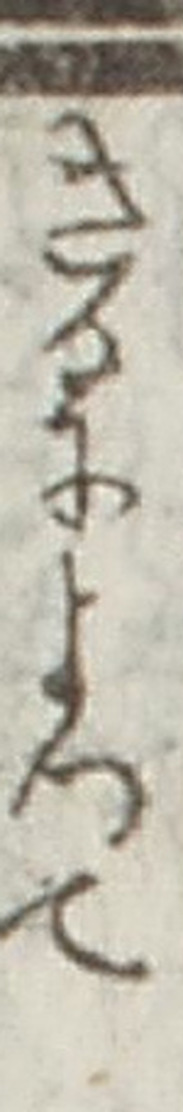さるによつて
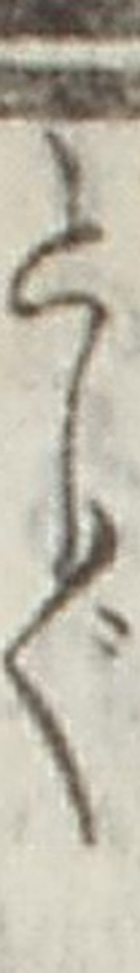とし〴〵
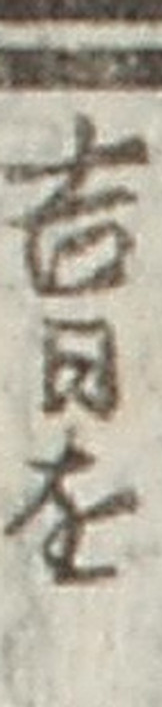吉日を
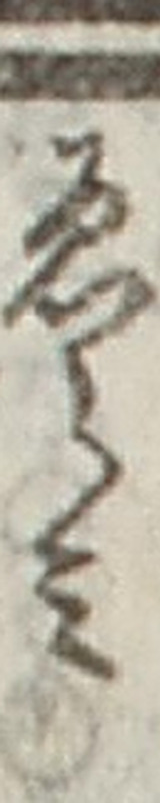ゑらミ
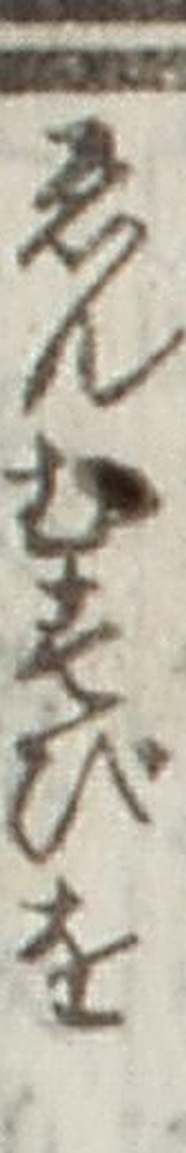ゑんむすびを
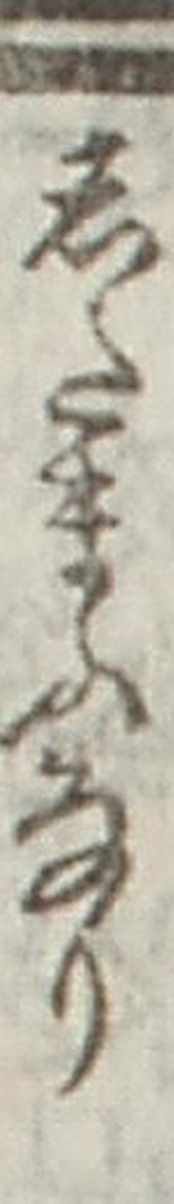したまふなり

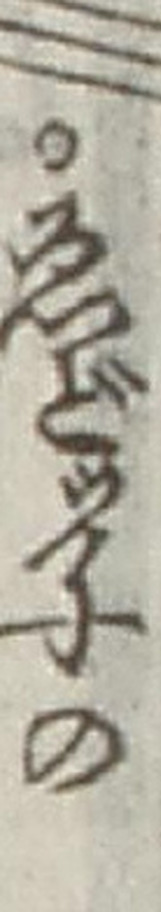○ゑどッ子の
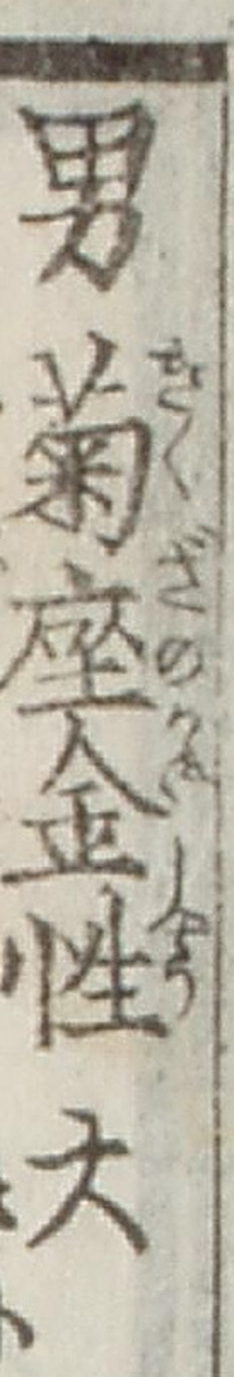男菊座金性
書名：三世相出雲當座帳　上下冊
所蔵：東京大学地震研究所図書室 Earthquake Research Institute Library, The University of Tokyo, JAPAN
